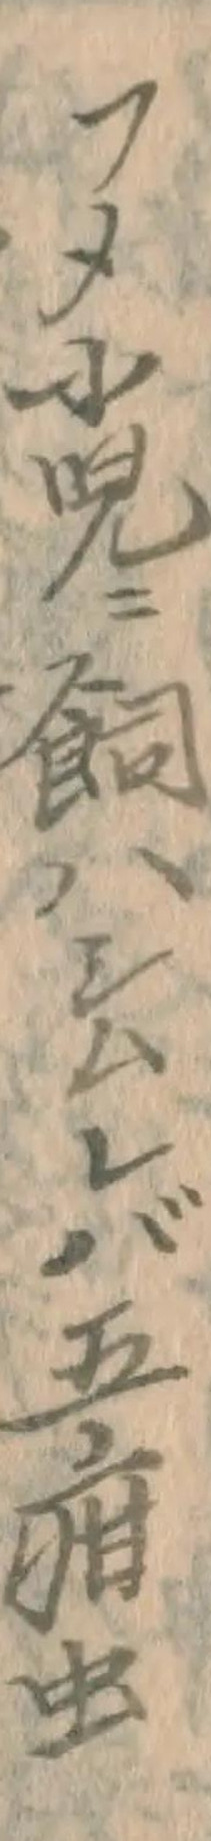フシテ小児ニ飼ハシムレバ五疳虫
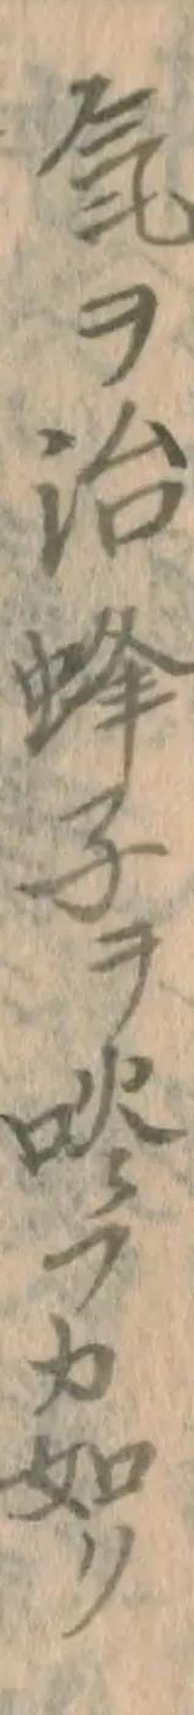気ヲ治蜂子ヲ啖フカ如ク
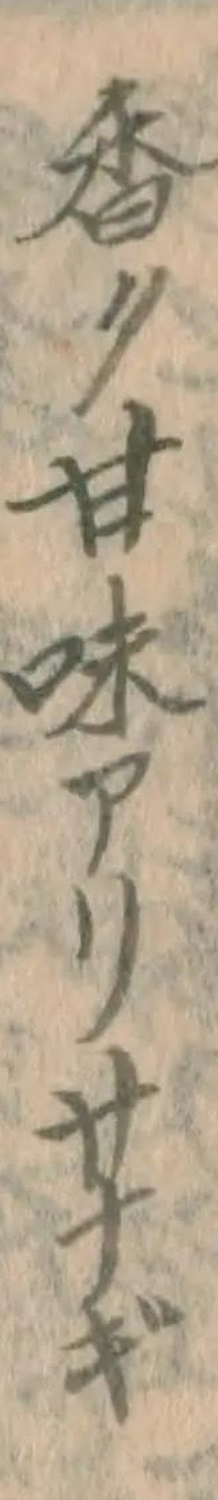香ク甘味アリサナギ
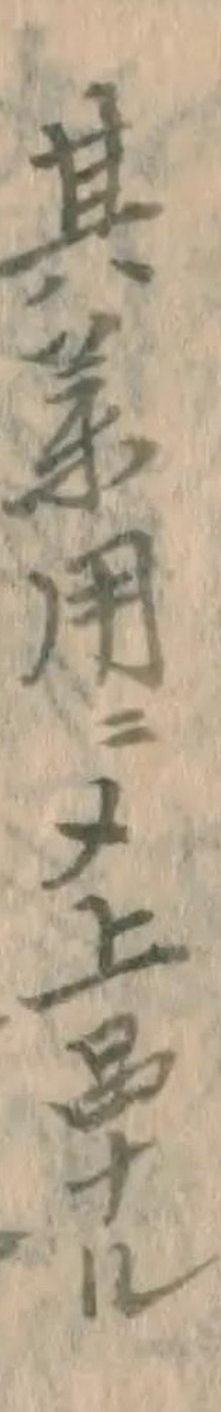其薬用ニシテ上品ナル
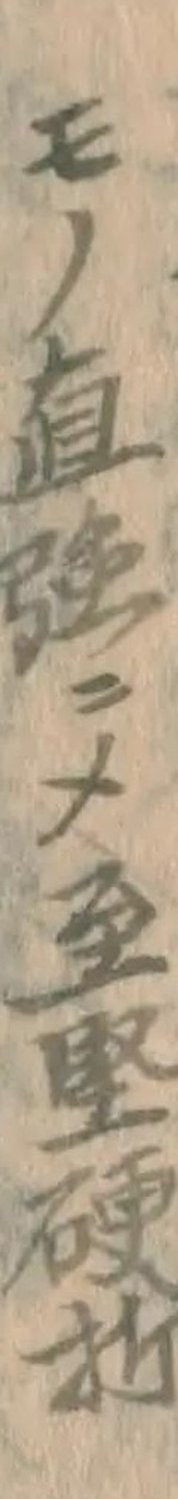モノ直強ニシテ至堅硬折
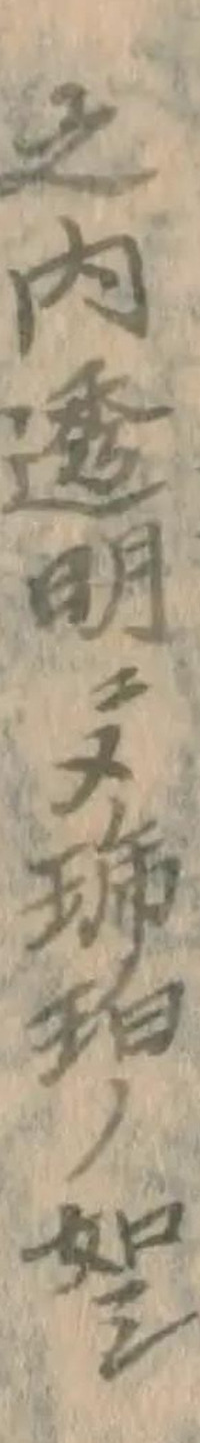之内透明ニシテ琥珀ノ如シ
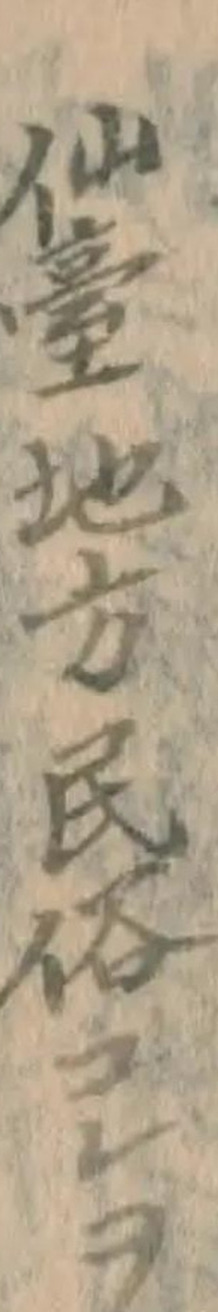仙臺地方民俗コレヲ
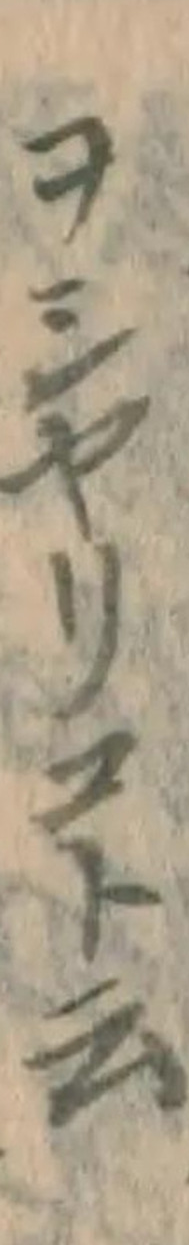ヲシヤリコト云
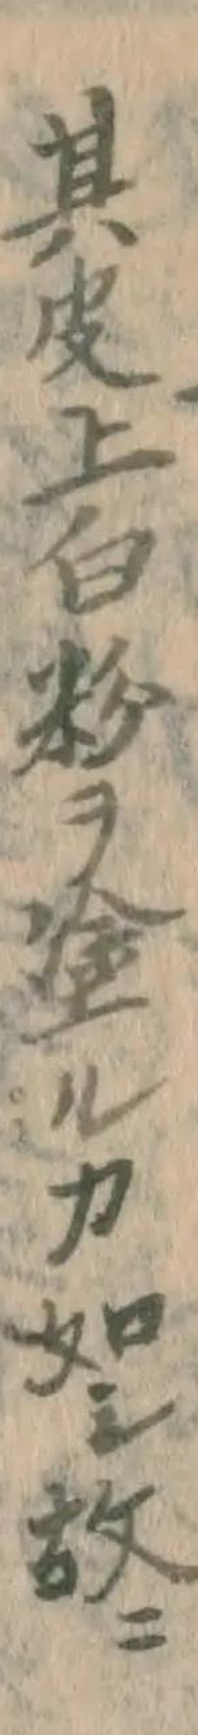其皮上白粉ヲ塗ルカ如シ故ニ
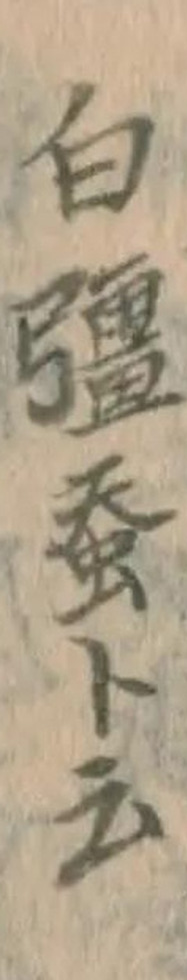白殭蚕ト云
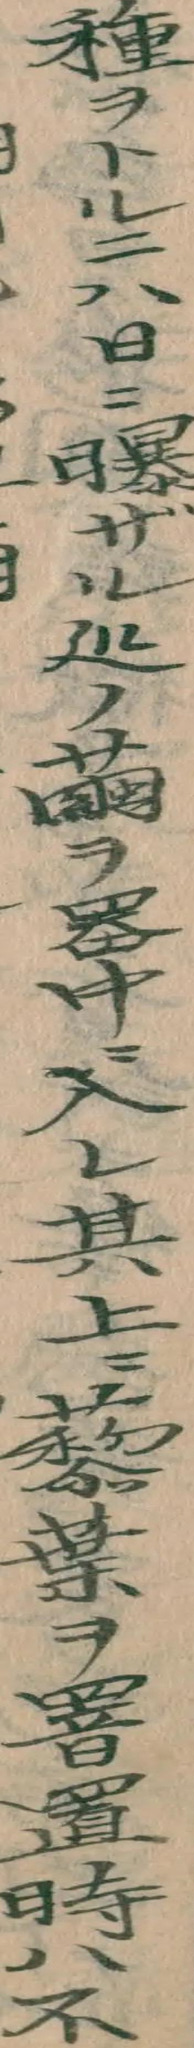種ヲトルニハ日ニ曝ザル処ノ繭ヲ器中ニ入レ其上ニ藜葉ヲ罯置時ハ不
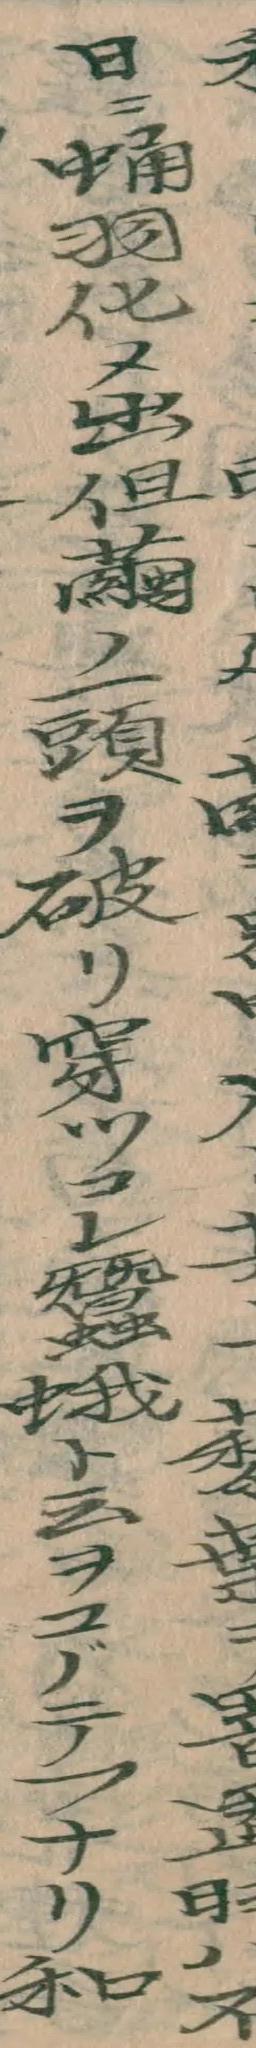日ニ蛹羽化シテ出但繭ノ一頭ヲ破リ穿ツコレ蠶蛾ト云ヲコノテフナリ和
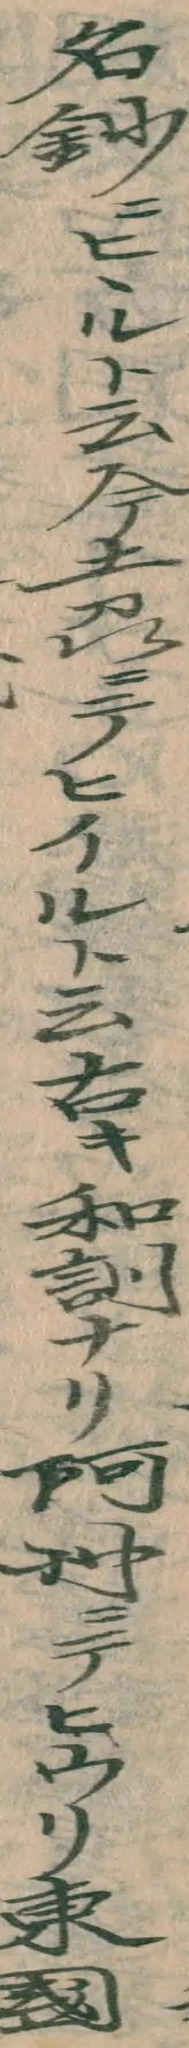名鈔ニヒヽルト云今土州ニテヒイルト云古キ和訓ナリ阿州ニテヒウリ東國
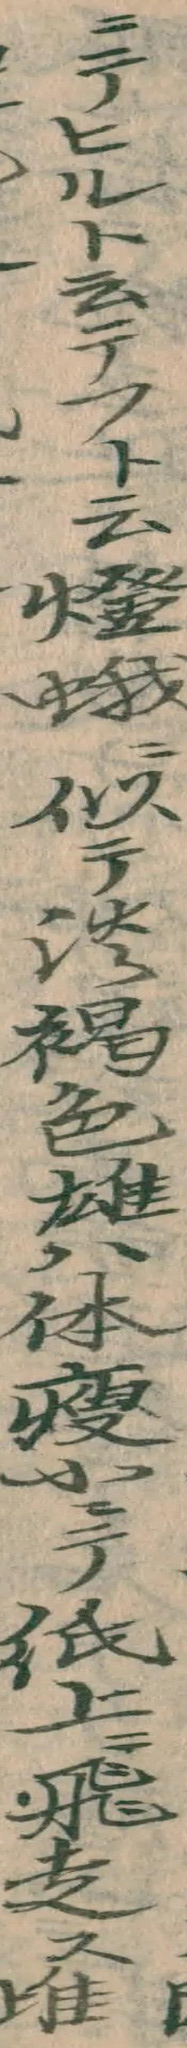ニテヒルト云テフト云燈蛾ニ似テ淡褐色雄ハ体痩小ニテ紙上ニ飛走ス雌
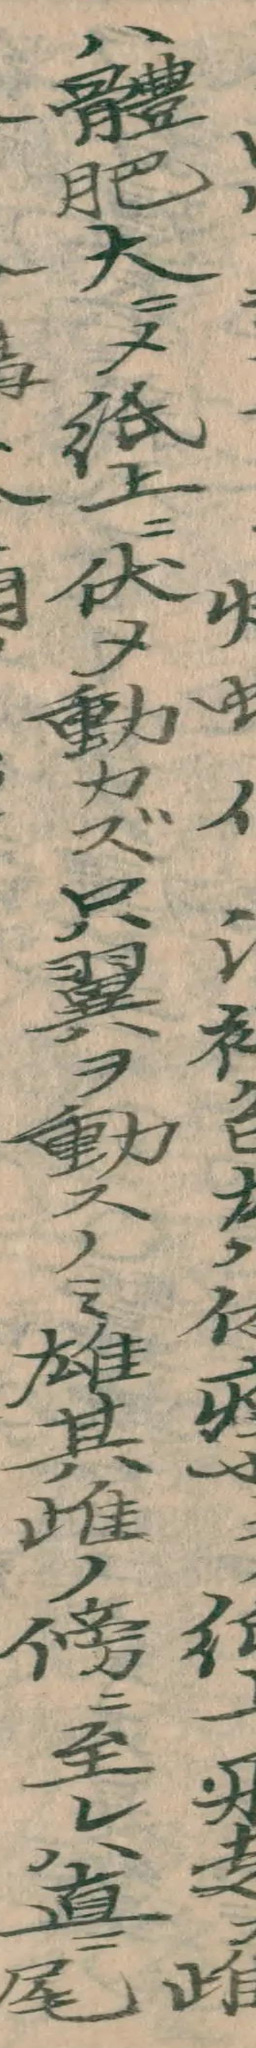ハ體肥大ニシテ紙上ニ伏シテ動カズ只翼ヲ動スノミ雄其雌ノ傍ニ至レハ直ニ尾
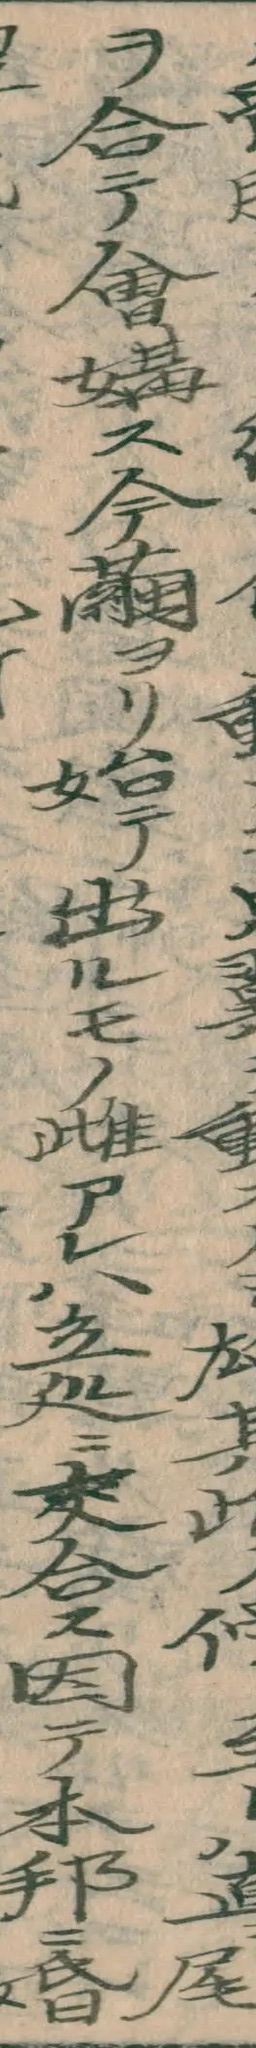ヲ合テ會媾ス今繭ヨリ始テ出ルモノ雌アレハ立処ニ夾合ス因テ本邦ニ婚
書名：千蟲譜 3巻. [1]
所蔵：国立国会図書館 National Diet Library, JAPAN
